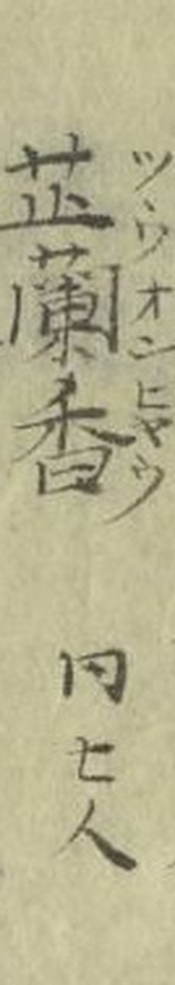芷蘭香同七人
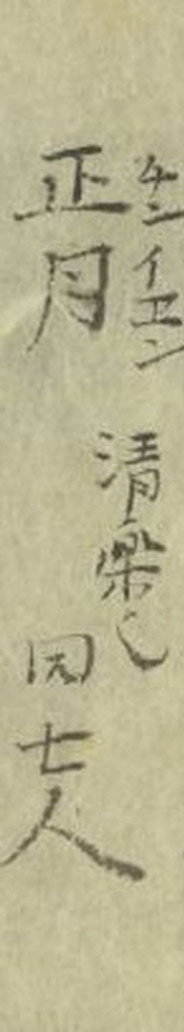正月清楽也同七人
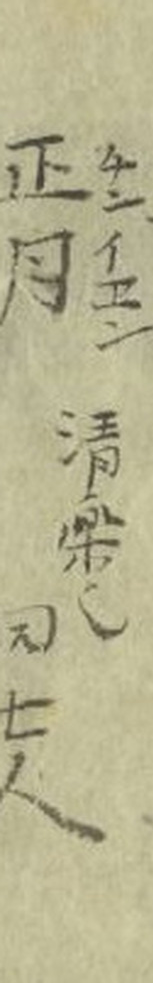正月清楽也同七人
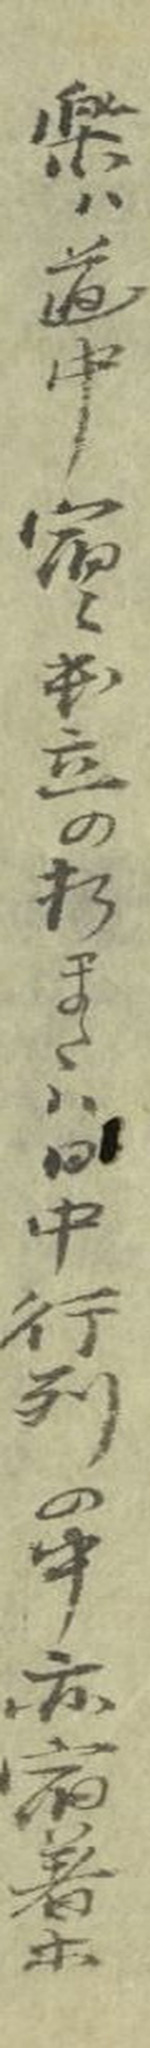楽は道中宿に出立の折または日中行列の中亦宿着等
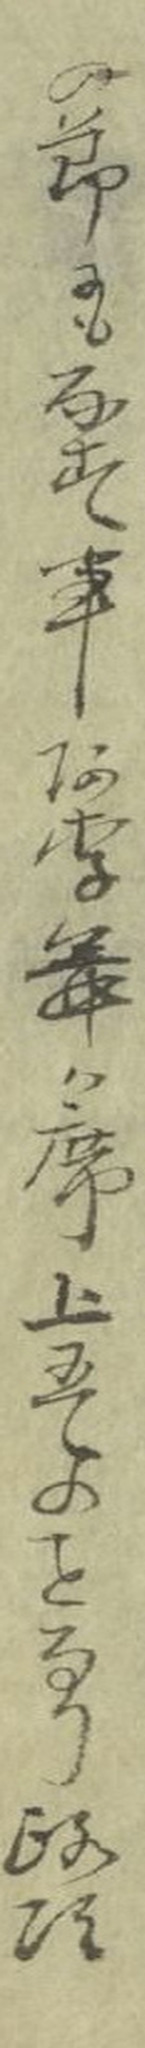の節にもなす事あり舞は席上にてのことなり路頭
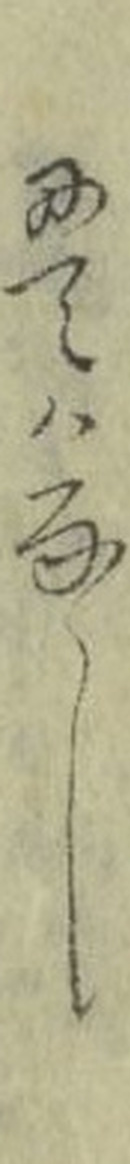にてはなし

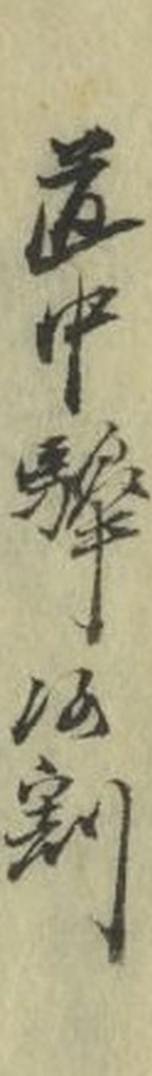道中駅路割
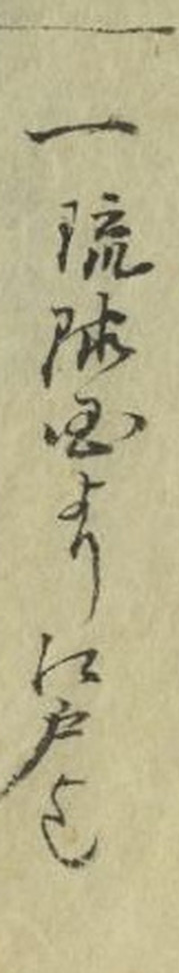一琉球国より江戸迠
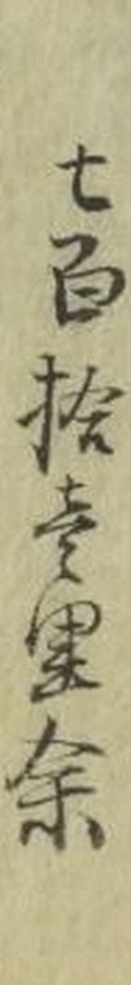七百拾壱里余
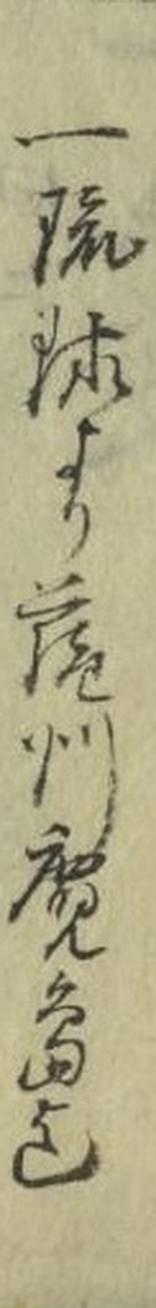一琉球より薩州麑島迠
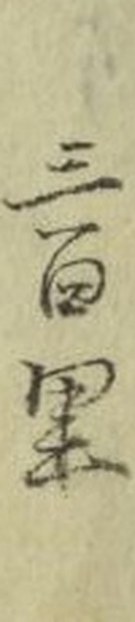三百里
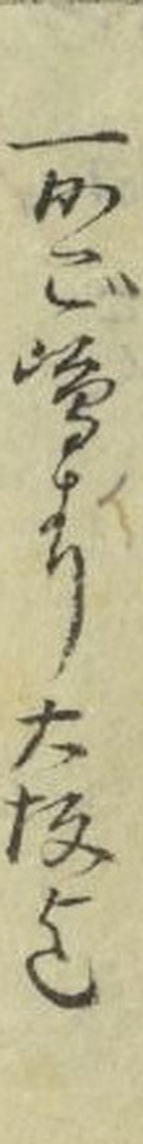一かご嶋より大坂迠
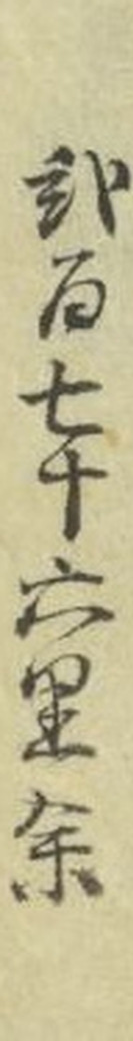弐百七十六里余
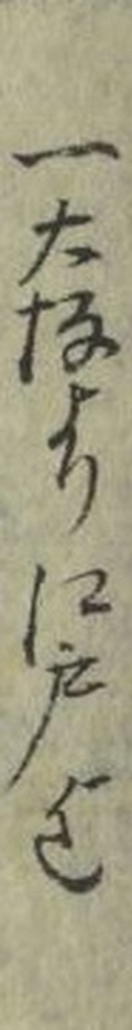一大坂より江戸迠
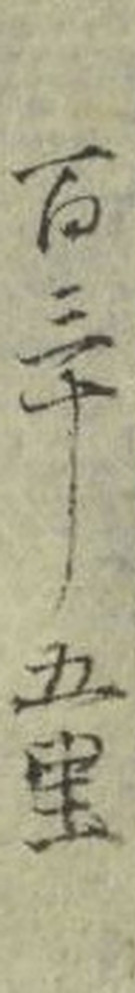百三十五里
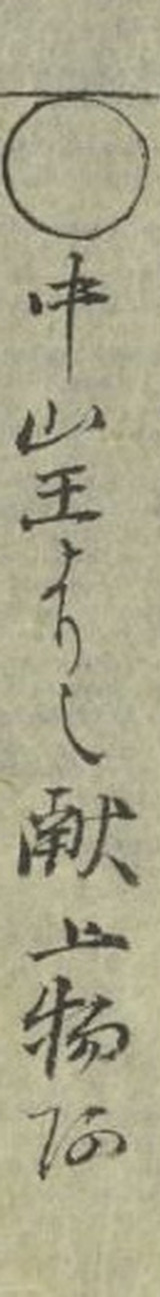○中山王より之献上物あ
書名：天保三年来朝 琉球人行列記
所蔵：University of the Ryukyus Library
